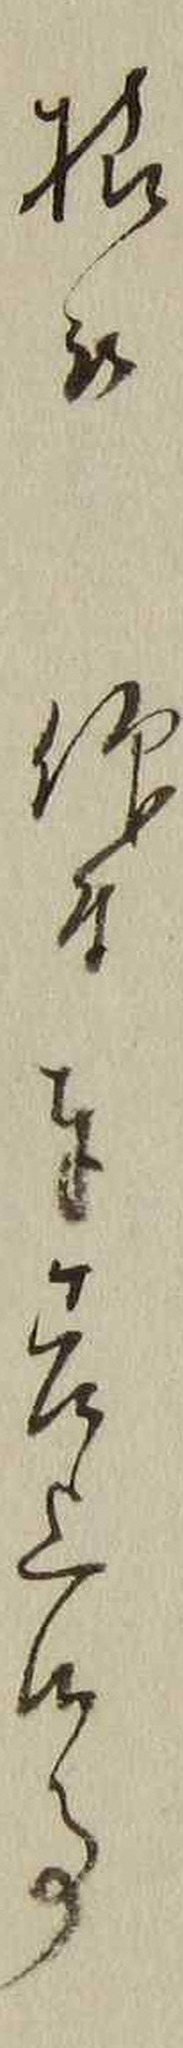様被仰付奉差上候事
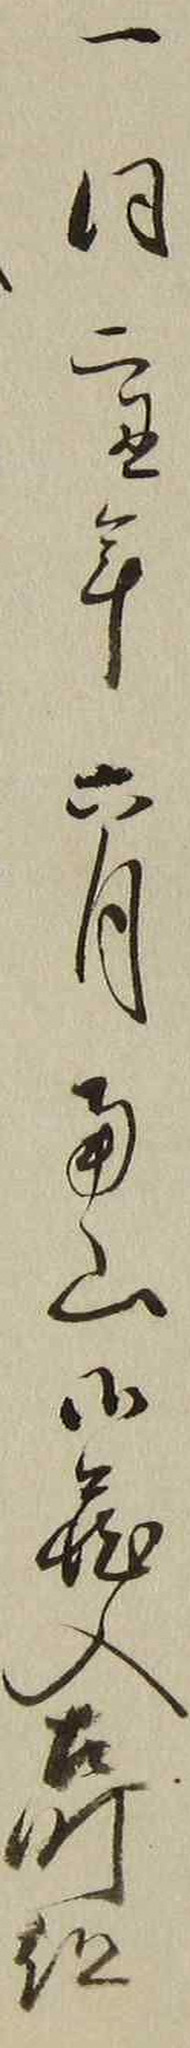一同二丑年六月南山御蔵入古町組
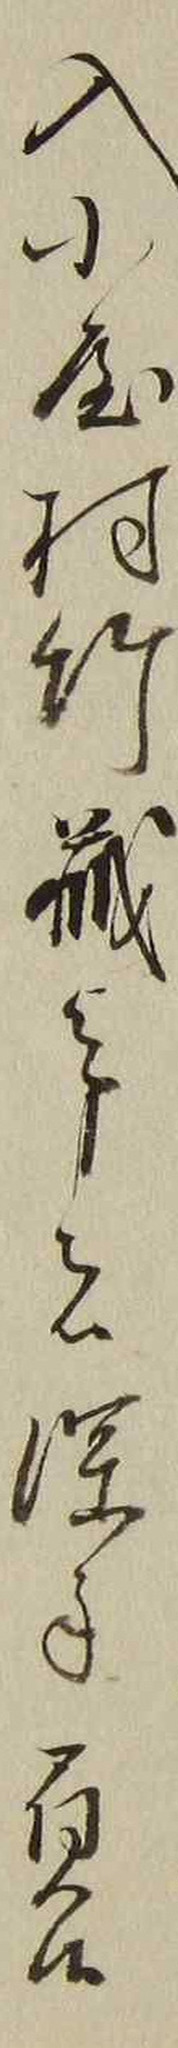入小屋村竹蔵与申者深手負候
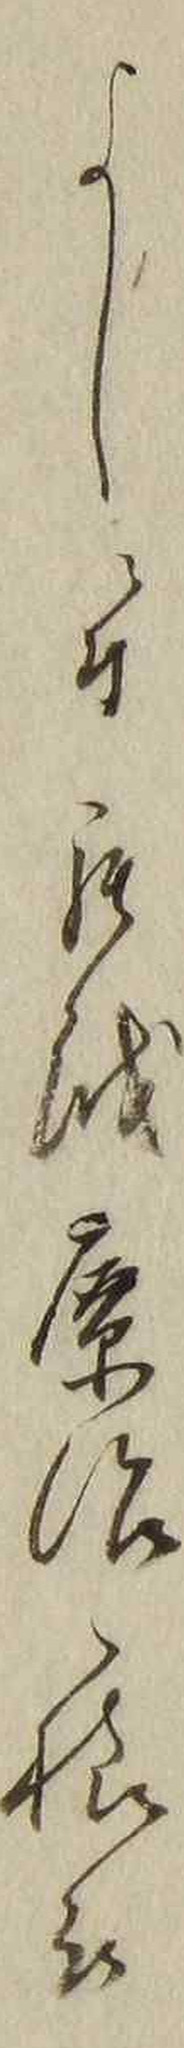よしニ付罷越療治候様被
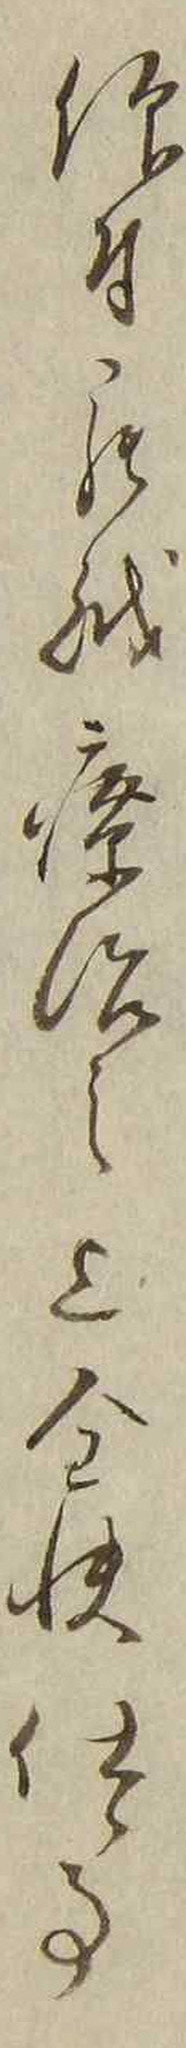仰付罷越療治之上全快仕候事

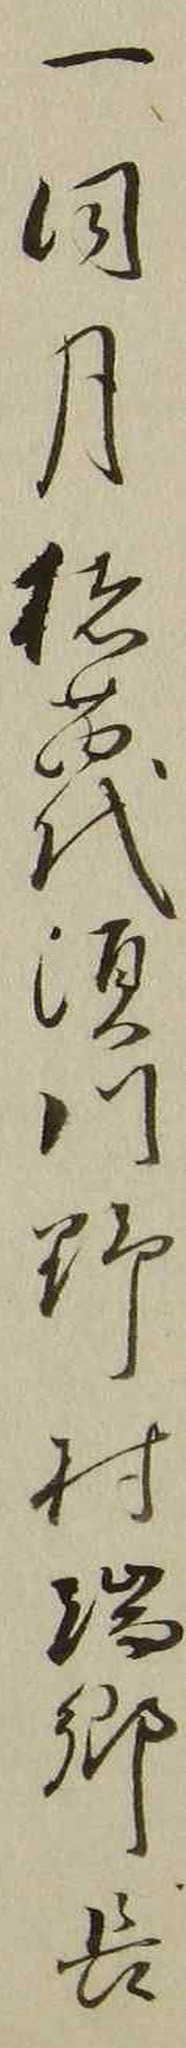一同月猪苗代須川野村端郷長
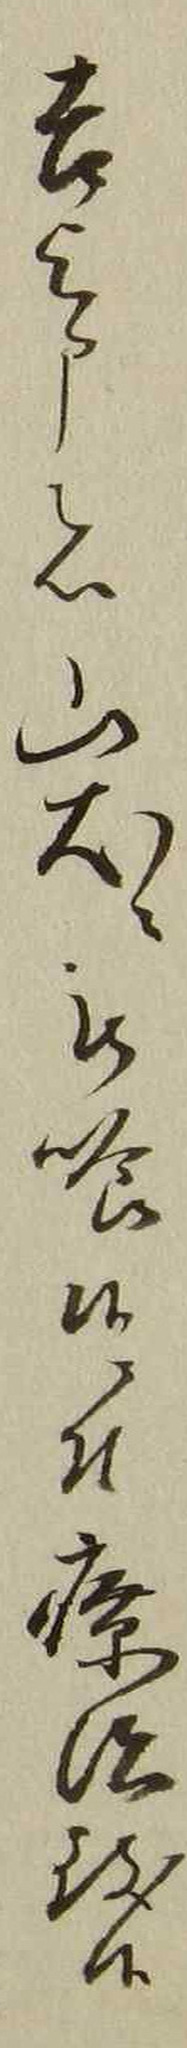吉与申者山犬ニ被喰候ニ付療治致候
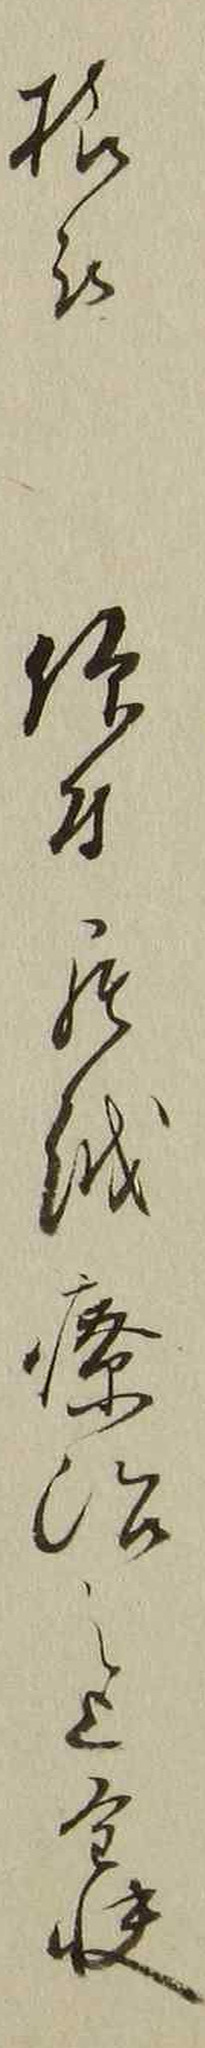様被仰付罷越療治之上全快
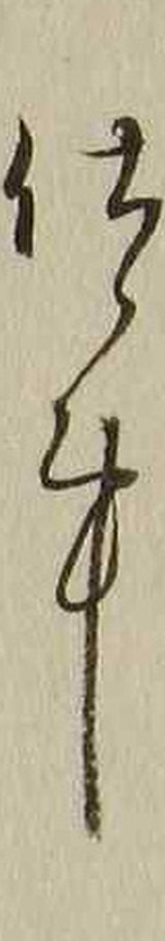仕候事
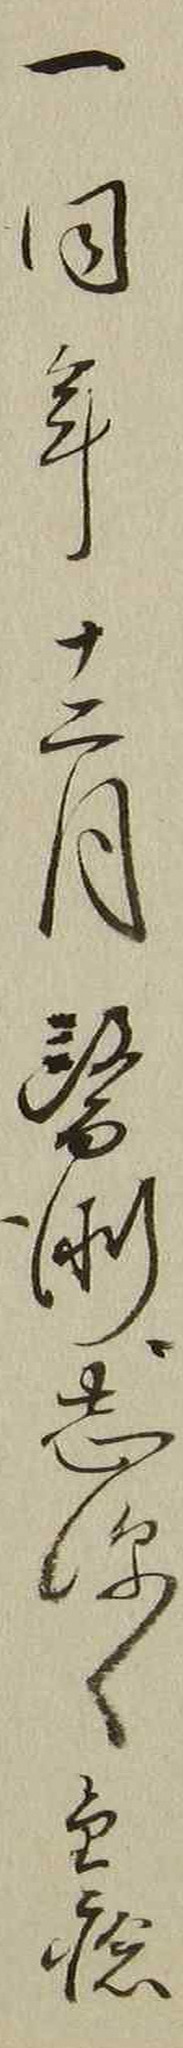一同年十二月医術ニ志深く金瘡
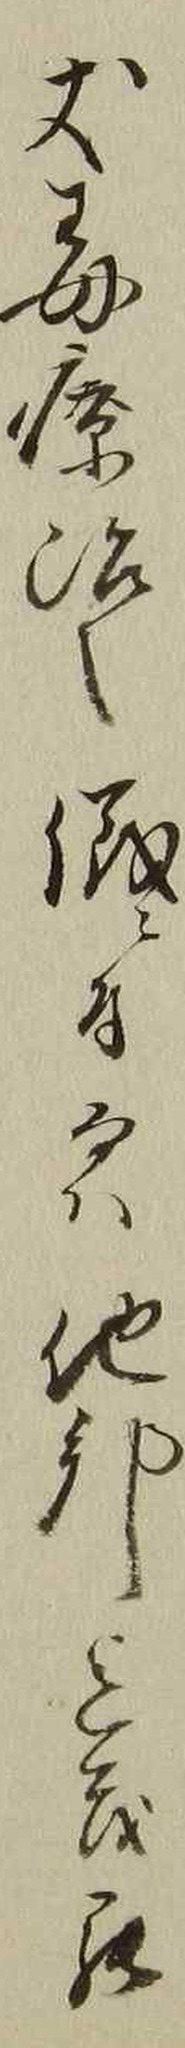犬毒療治之儀ニ付而ハ地邦迄も罷
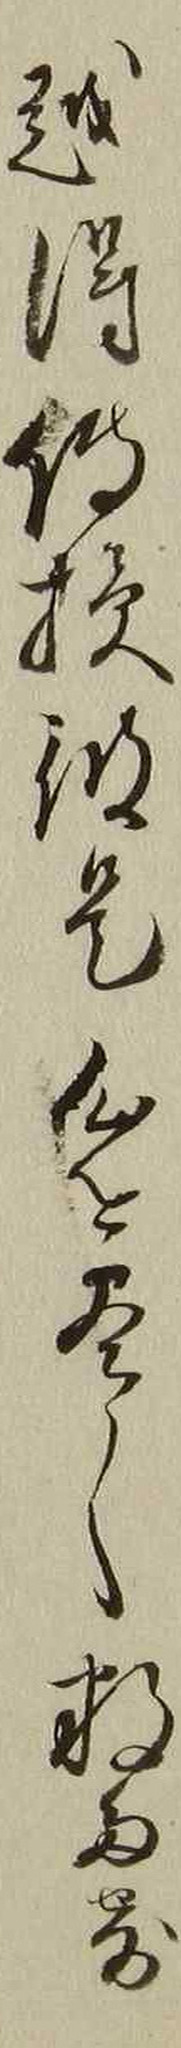越得伝損彼是心を尽し数多奇
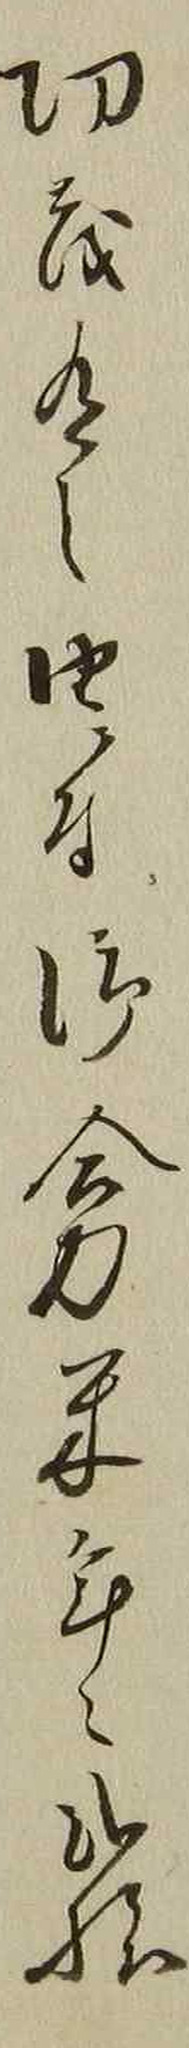功も有之由ニ付御合力米年ニ弐拾
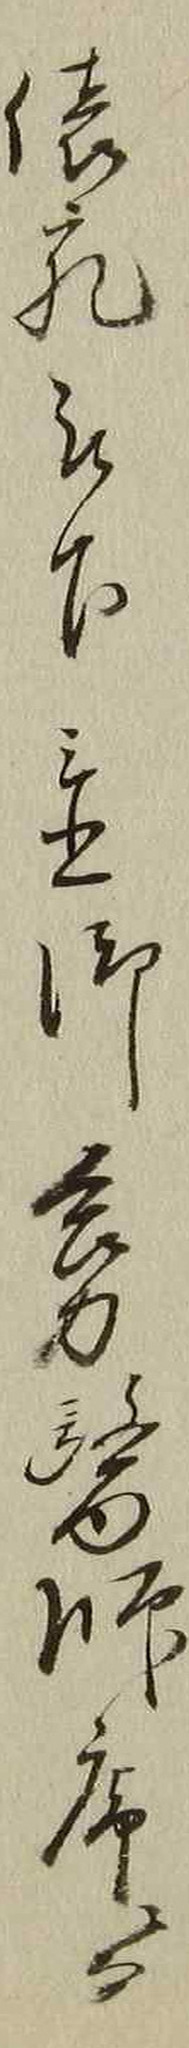俵宛被下置御合力医師席ニ而
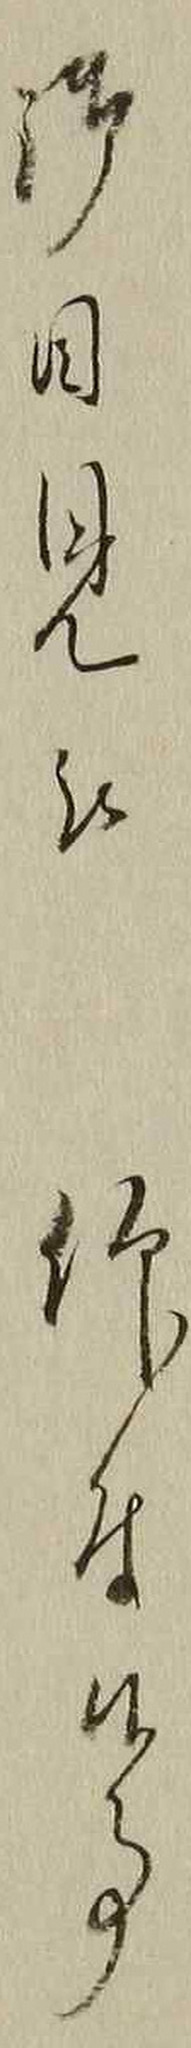御目見被仰付候事
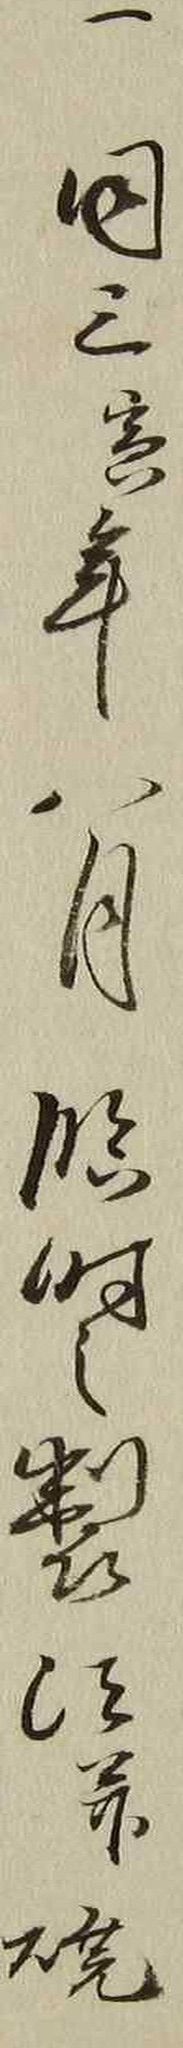一同三寅年八月臨時之製法幷焼
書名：諸士系譜　巻之129　た之部5
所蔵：会津若松市立会津図書館
